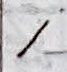1
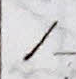1
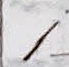1
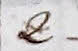2
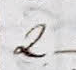2
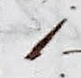1
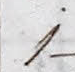1
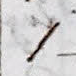1
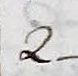2
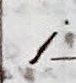1
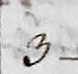3
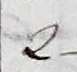2
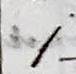1
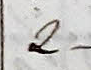2
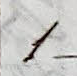1
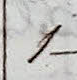1
